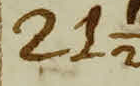21
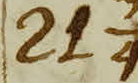21
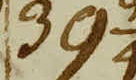39
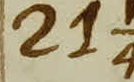21
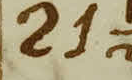21
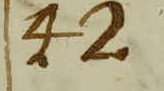42
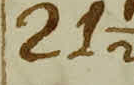21
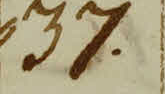37
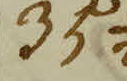35
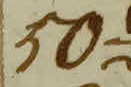50
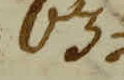63
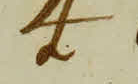4
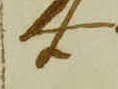4
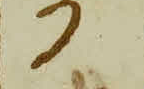5
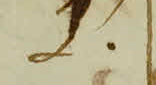1.
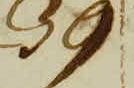39
